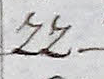22
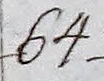64
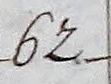62
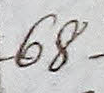68
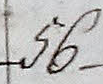56
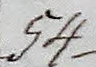54
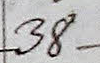38
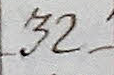32
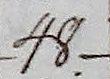48
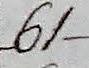61
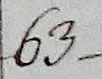63
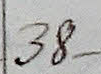38
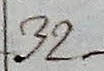32
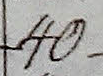40
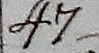47
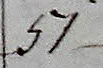57
